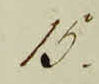15
